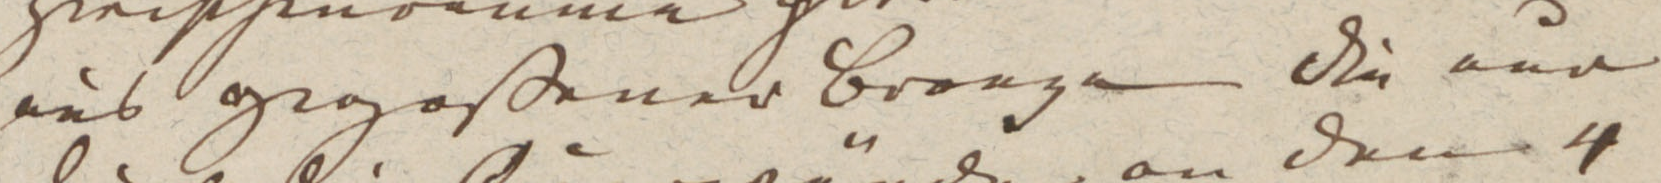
aus gegossener Bronze die nur
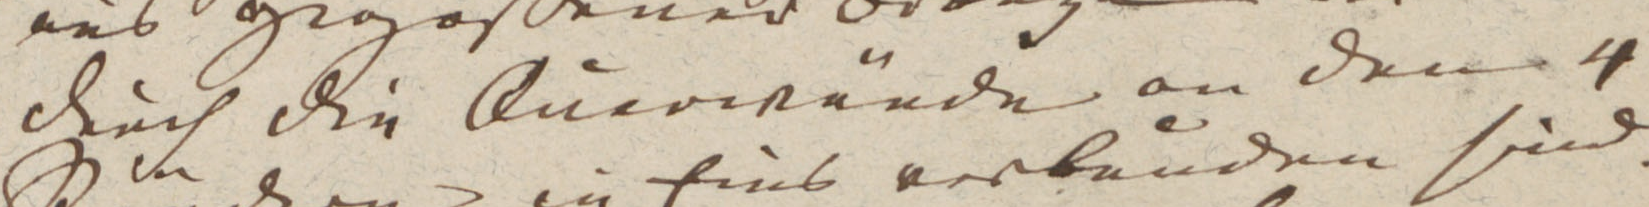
durch die Querwände an den 4
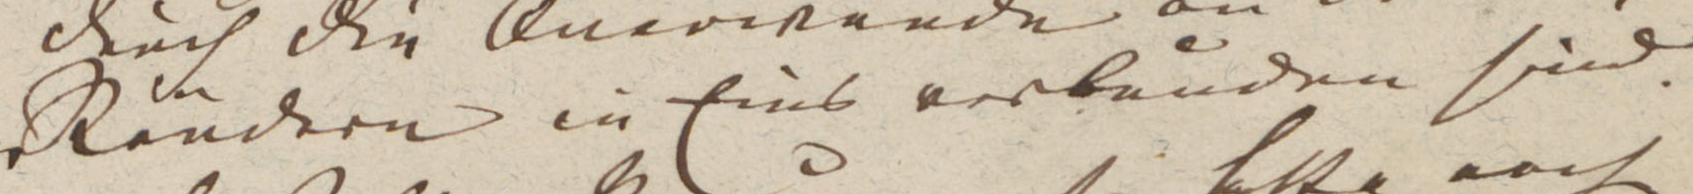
Rändern in Eins verbunden sind.
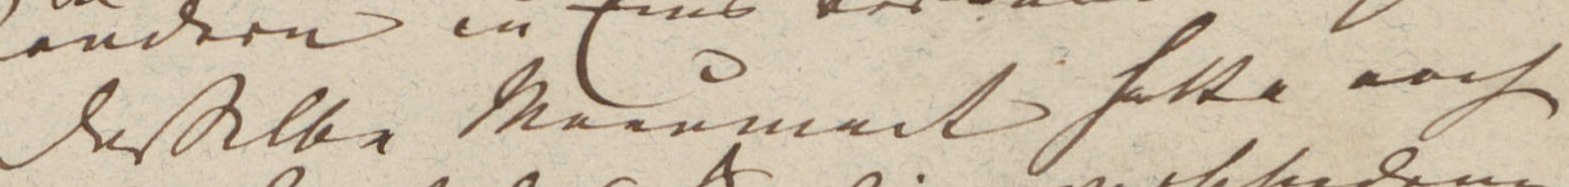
Dasselbe Monument hatte noch
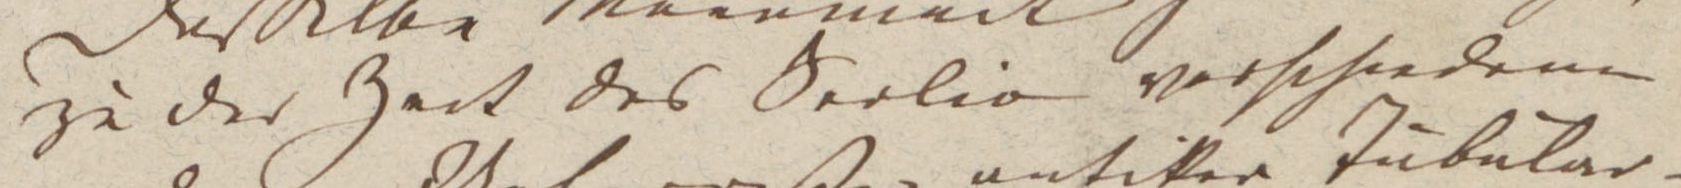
zu der Zeit des Serlio verschiedene
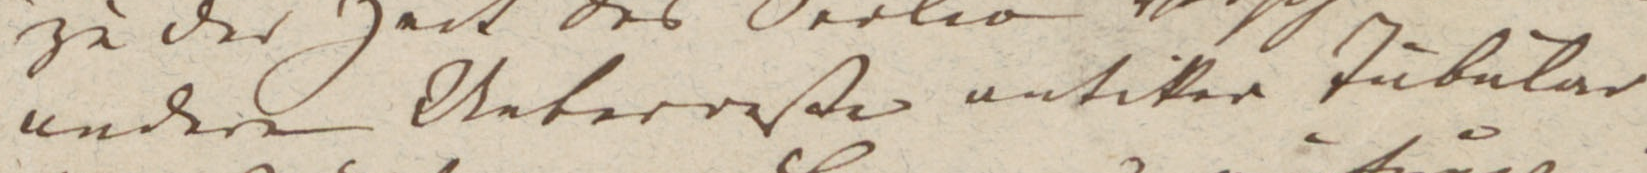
andere Ueberreste antiker Tubular-
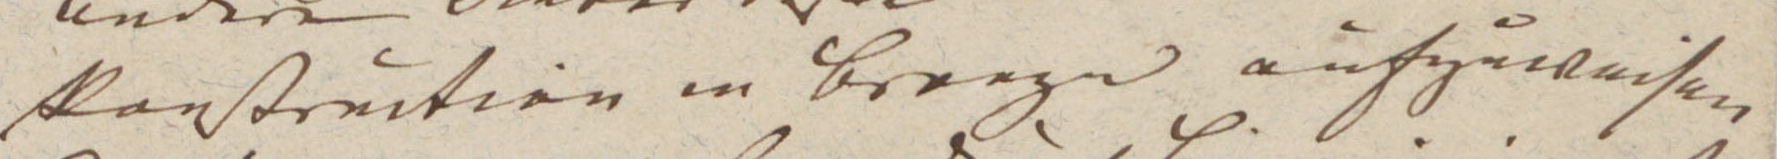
konstruction in Bronze aufzuweisen
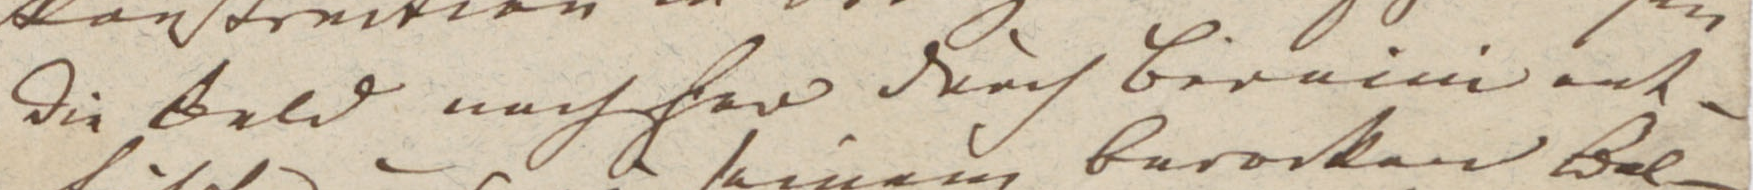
die bald nachher durch Bernini ent-
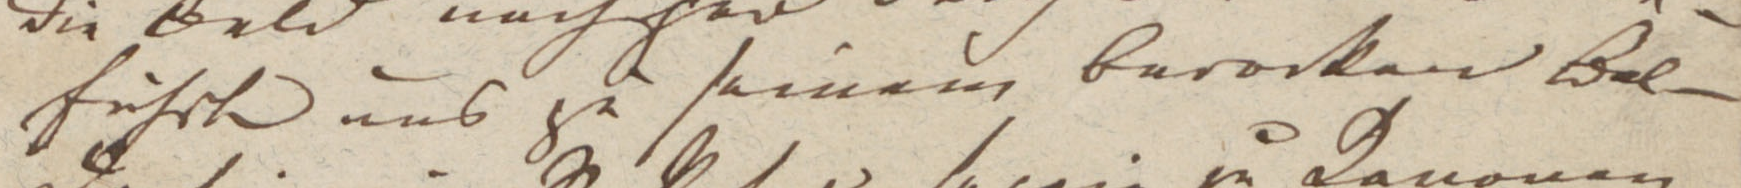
führt uns zu seinem barocken Bal-
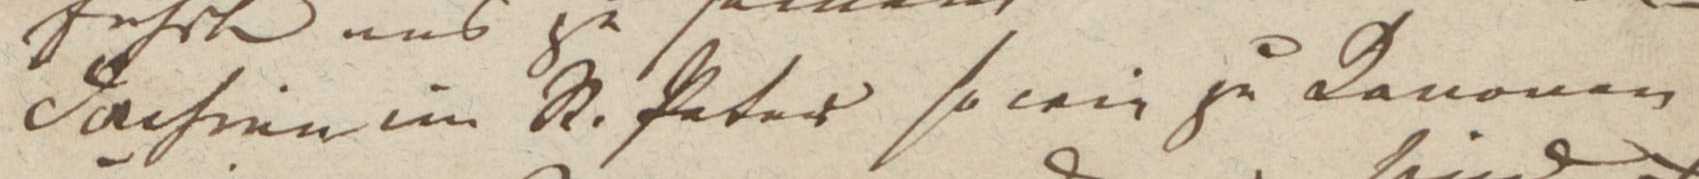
dachine im St. Peter so wie zu Kanonen
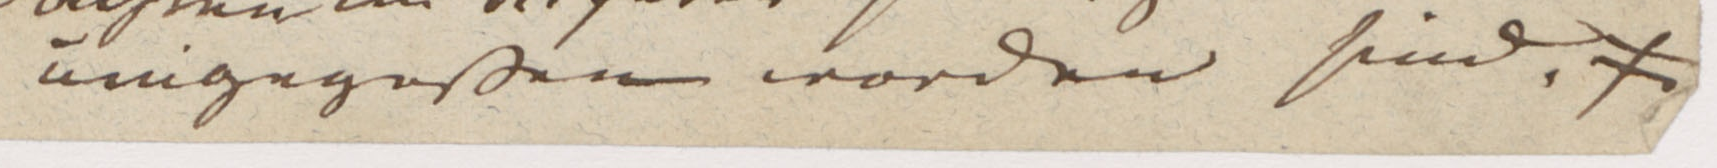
umgegossen worden sind. %
